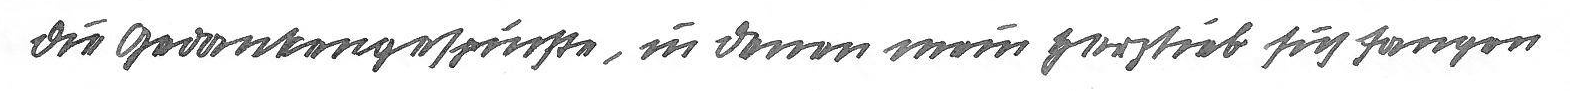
die Gedankengespinste, in denen mein Herzlieb sich fangen
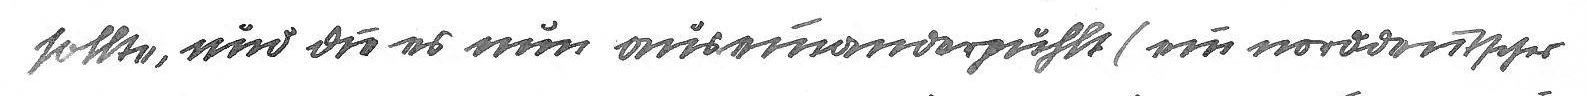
sollte, und die es nun auseinanderpuhlt (ein norddeutscher
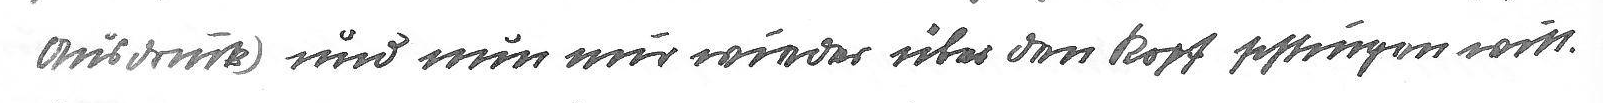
Ausdruck) und nun mir wieder über den Kopf schlingen will.
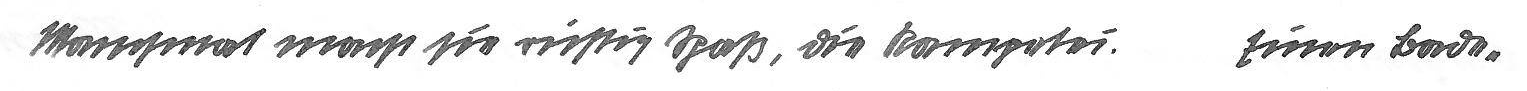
Manchmal macht sie richtig Spaß, die Kampelei. Einen Bade¬
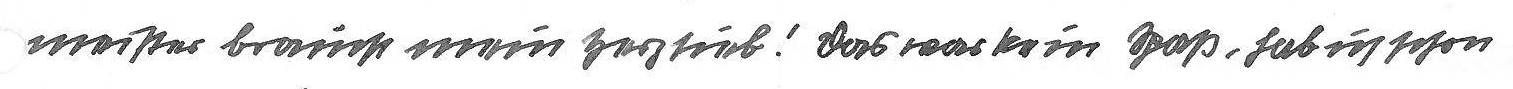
meister braucht mein Herzlieb! Das war kein Spaß, hab ich schon
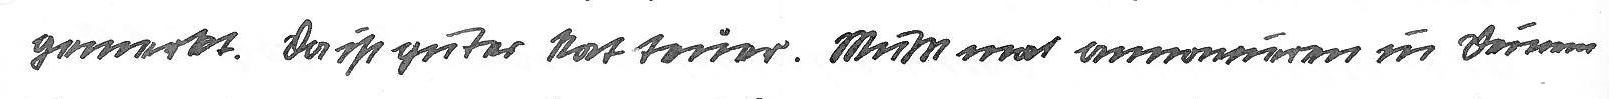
gemerkt. Da ist guter Rat teuer. Mußt mal annoncieren in Deinem
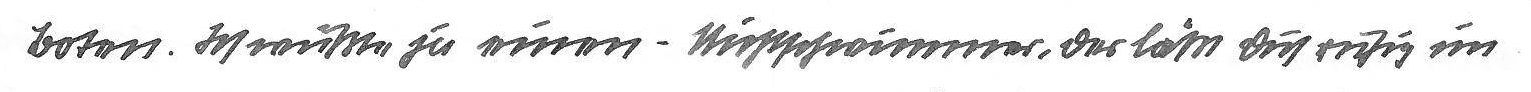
Boten. Ich wüßte ja einen – Nichtschwimmer, der läßt Dich ruhig im
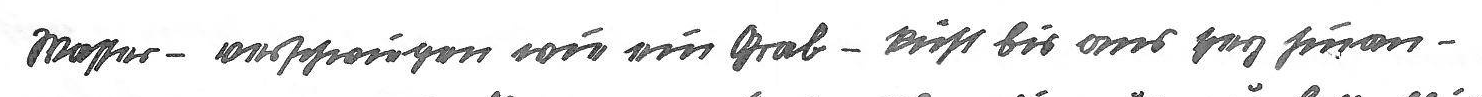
Wasser – verschwiegen wie ein Grab – kühl bis ans Herz hinan –
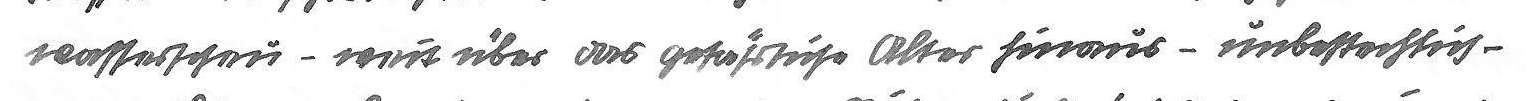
wasserscheu – weit über das gefährliche Alter hinaus – unbestechlich –
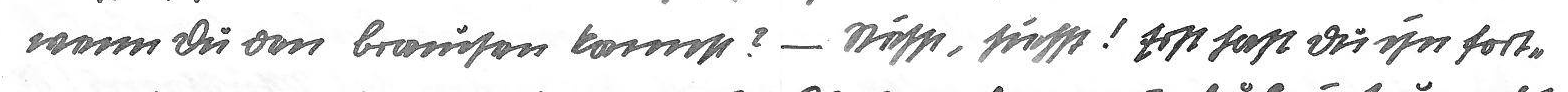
wenn Du den brauchen kannst? – Siehst, siehst! Erst hast Du ihn fort¬
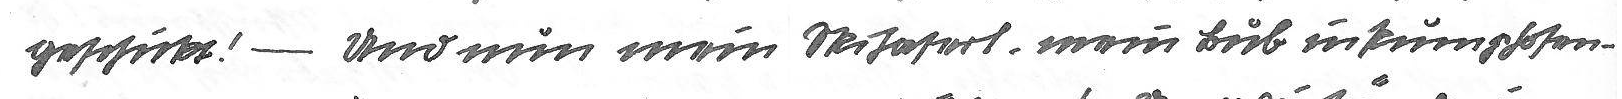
geschickt! – Und nun mein Skihaserl, mein Bub in Pumphosen –
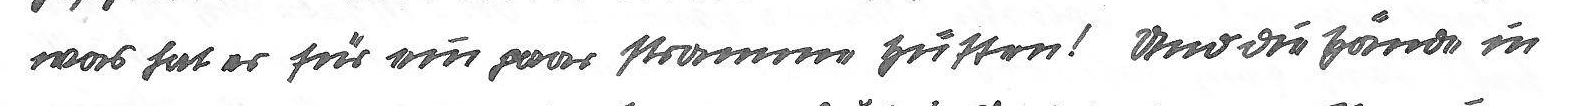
was hat er für ein paar stramme Hüften! Und die Hände in
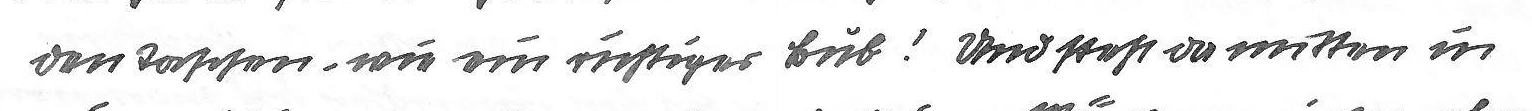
den Taschen, wie ein richtiger Bub! Und steht da mitten in
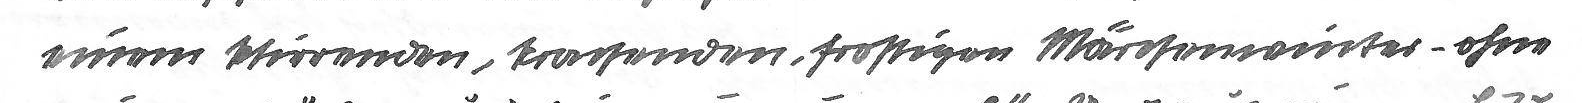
einem klirrenden, krachenden, frostigen Märchenwinter – ohne
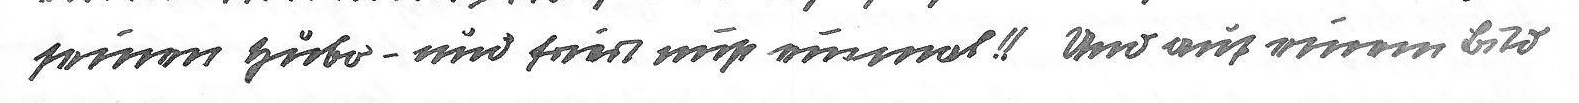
seinen Hubo – und friert nicht einmal!! Und auf einem Bild
